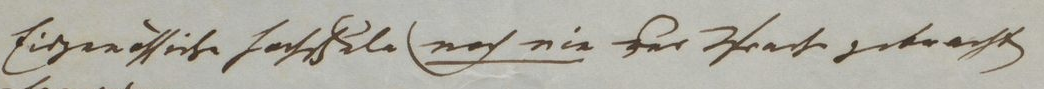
Eidgenössische Hochschule noch nie zur Sprache gebracht
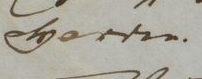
worden.
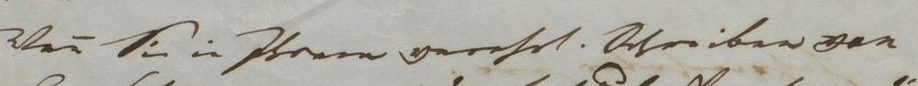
Wenn Sie in Ihrem verehrl. Schreiben von
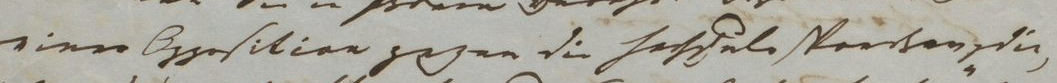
einer Opposition gegen die Hochschule sprechen, «die,
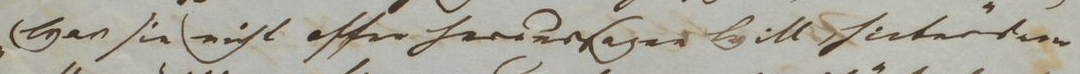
was sie nicht offen heraussagen will, hinter dem
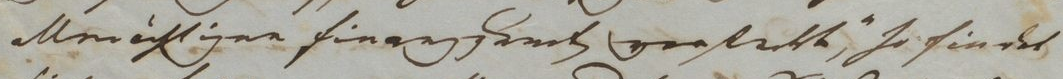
allmächtigen Finanzpunct versteckt», so findet
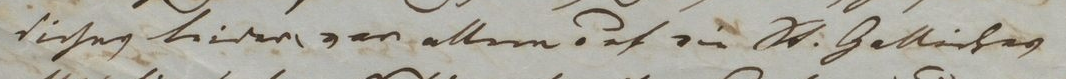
dieses leider vor allem auf ein St. Gallisches
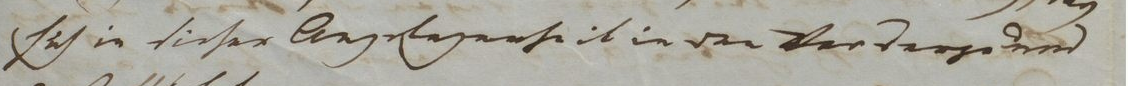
sich in dieser Angelegenheit in den Vordergrund
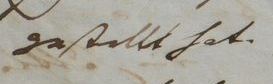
gestellt hat.
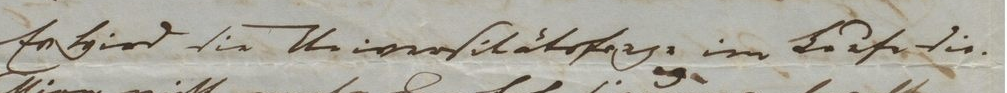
Es wird die Universitätsfrage im Laufe die-
